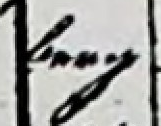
berg
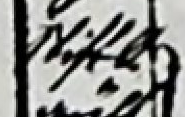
Stifts„
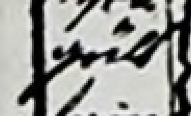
gütt
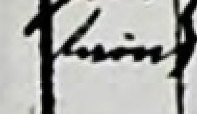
tein
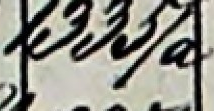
1335/a
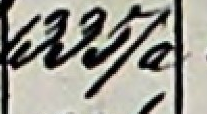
1335/a
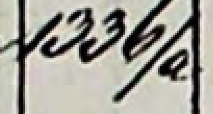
1336/a
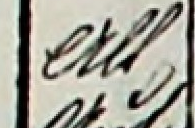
Alt
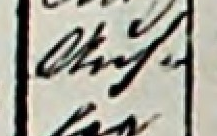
Aus„
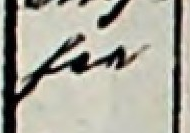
see
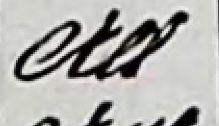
Alt
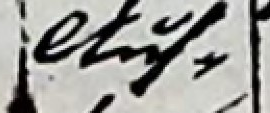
Aus„
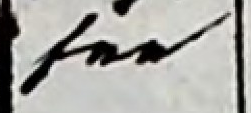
see
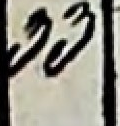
33
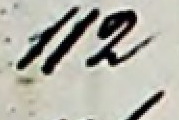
112
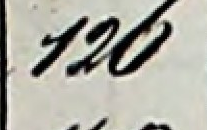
126
